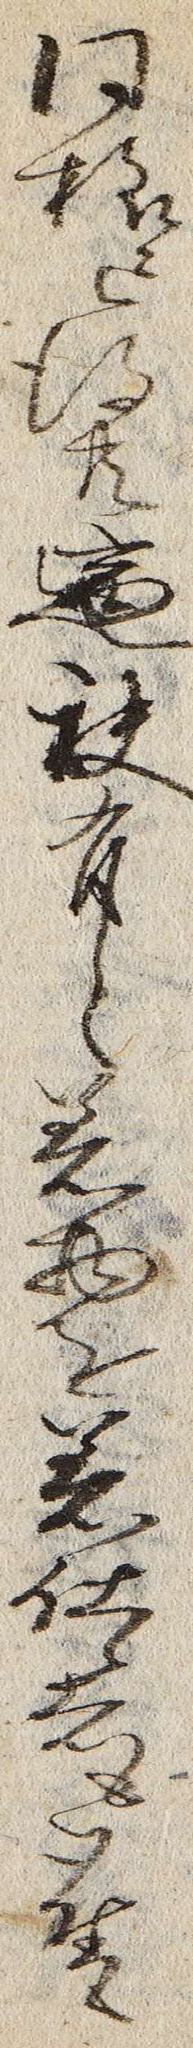同様に候得ども適袂有之着物を着仕候者も御座候
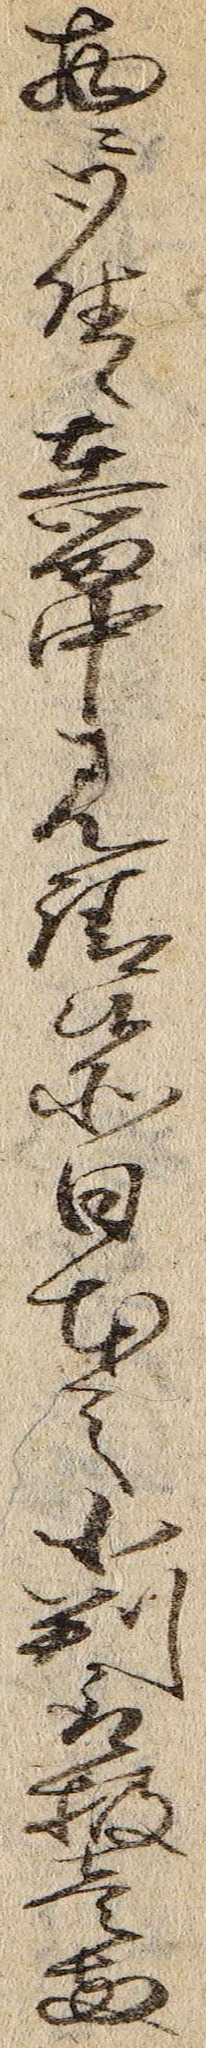物に御座候在留中見請候所日本の小判取扱一両
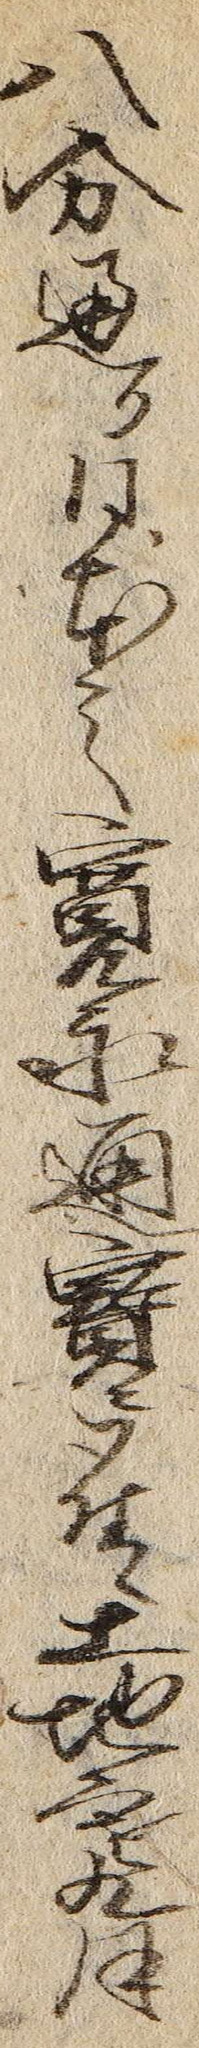八分通り日本の寛永通宝に御座候土地寒九月
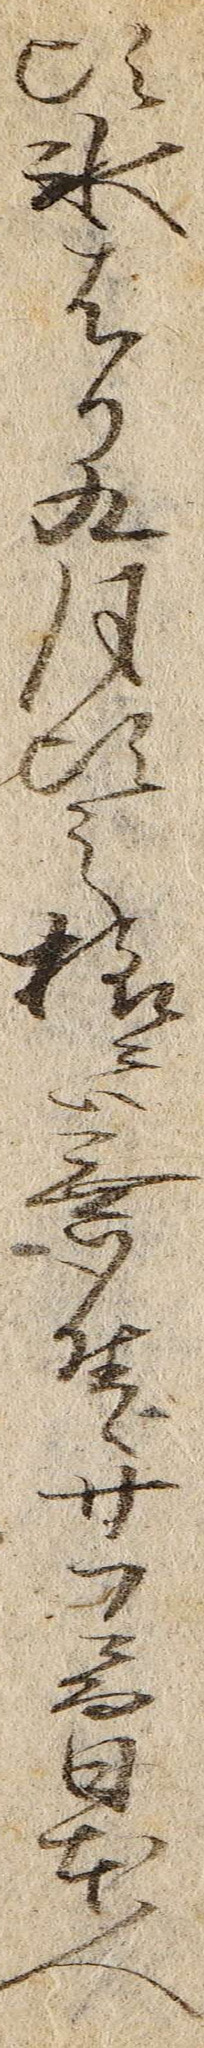頃氷はり九月頃の様には無御座候サフにて日本人
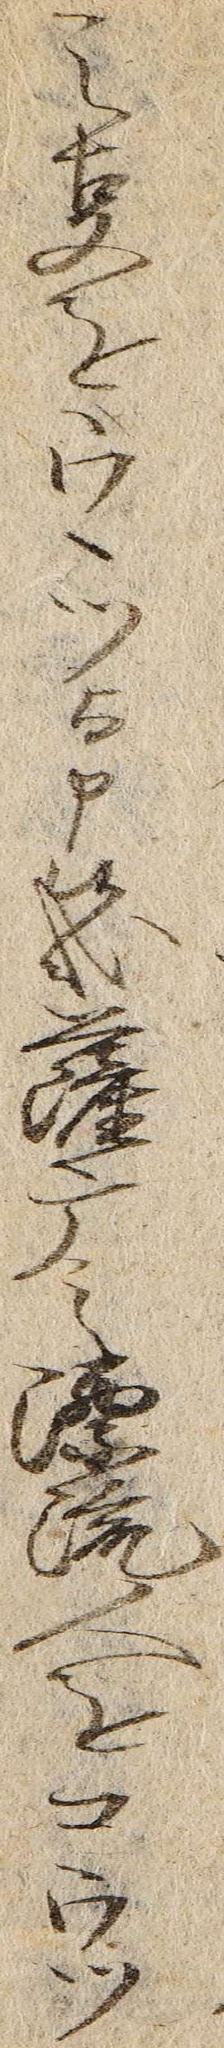の事をウヽツと申候哉薩摩の漂流人をコウツ
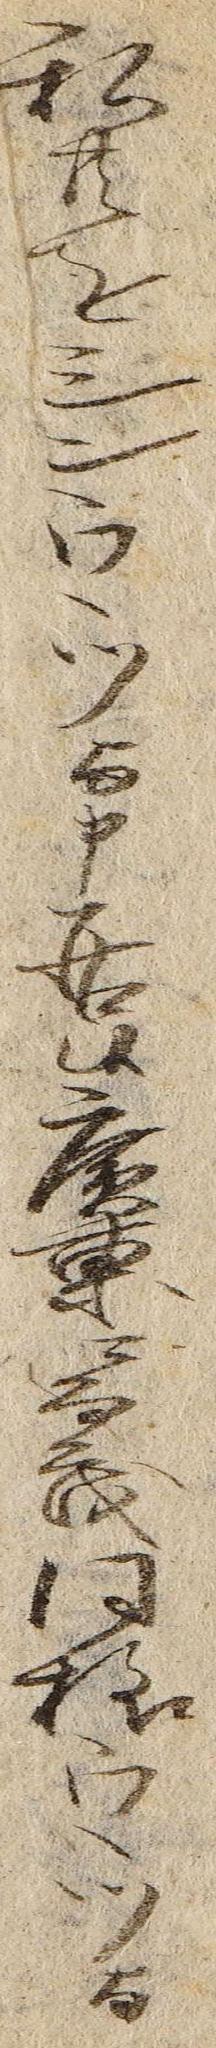私どもをシンウヽツと申居候広東にても同様ウヽツと
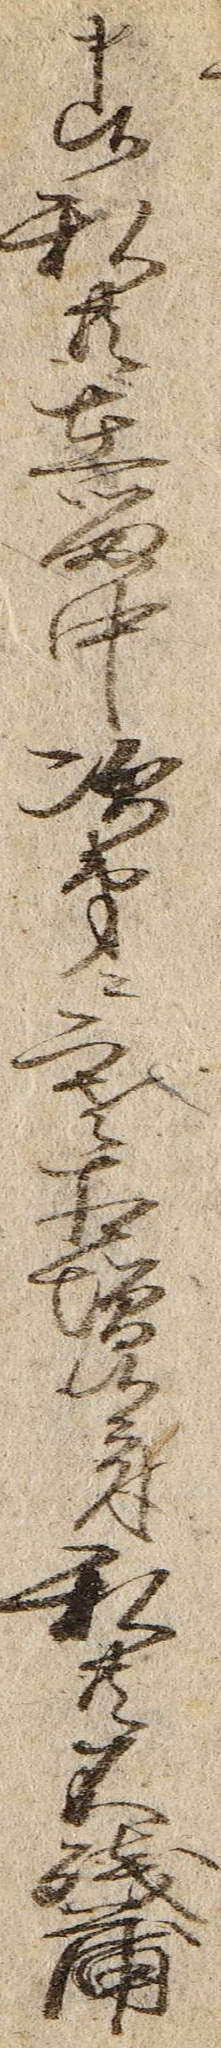申候私ども在留中次第に寒相増候に付私ども不残蒲
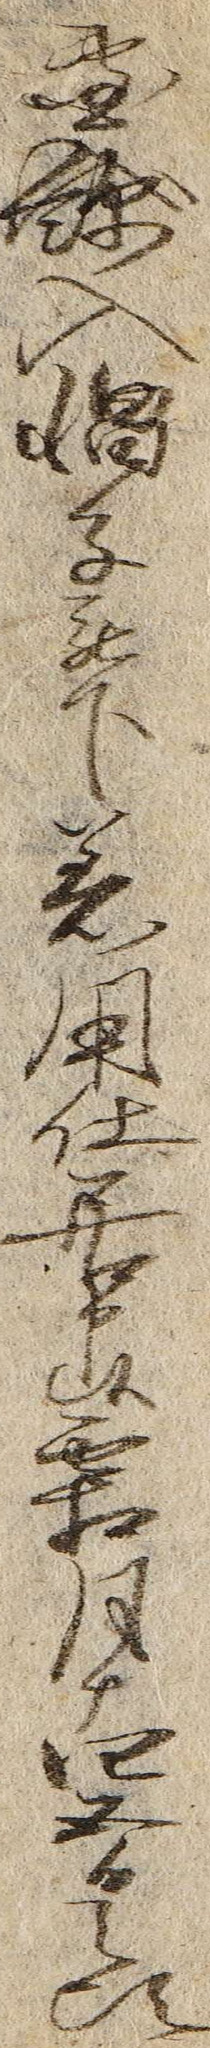団綿入帽子被下着用仕居申候霜月十四五日の頃
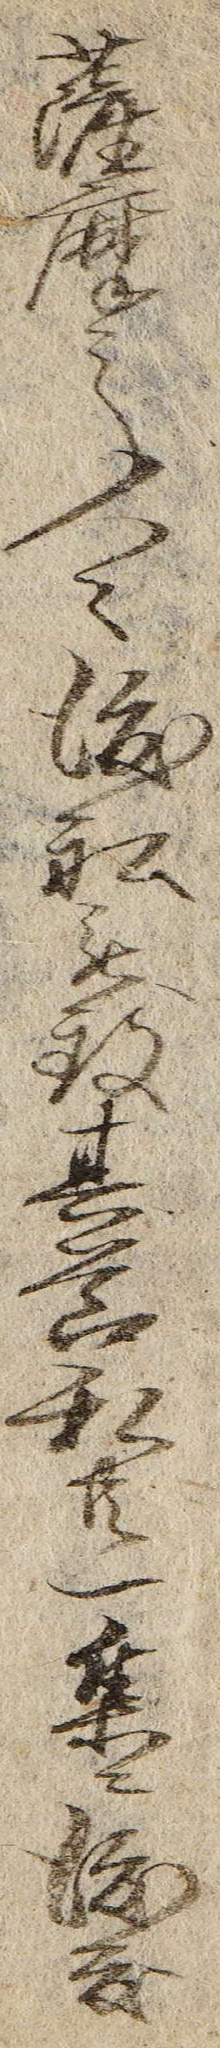薩摩の人々渡船被致其節私ども一集に渡度
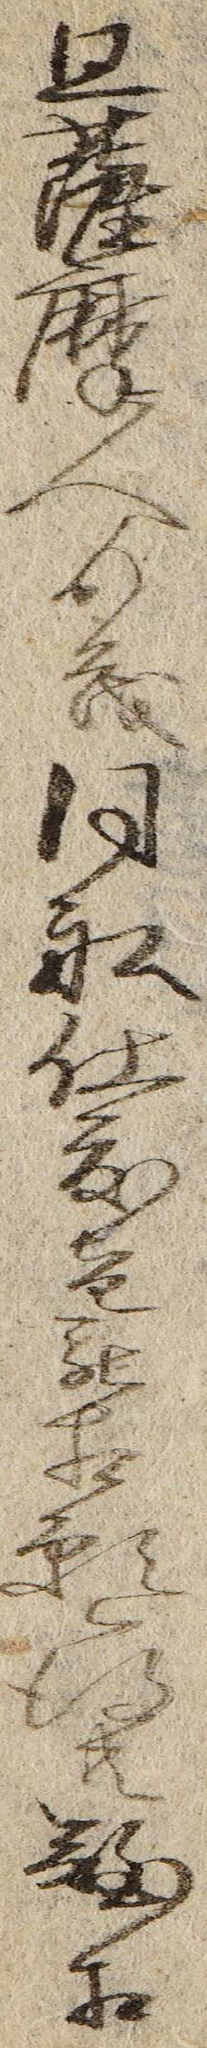且薩摩人よりも同船仕度旨被相頼候得ども難相
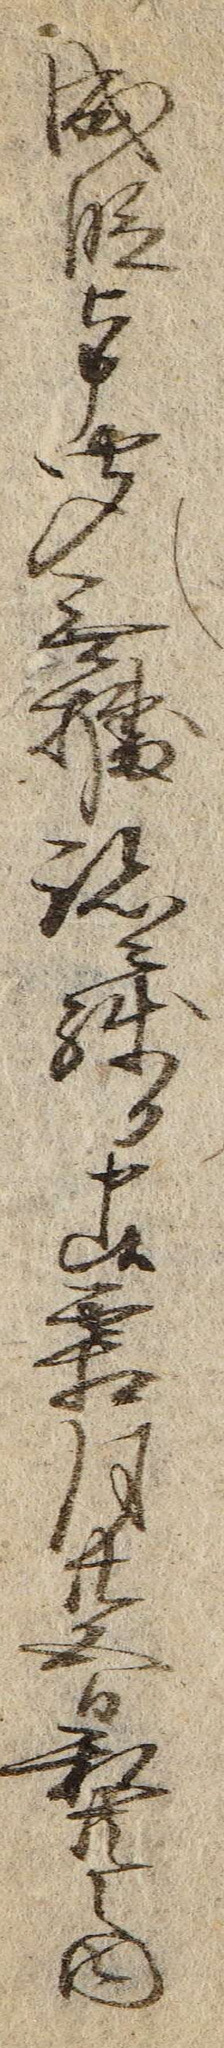成段被申聞無拠跡に残り申候霜月二十五日私どもの内

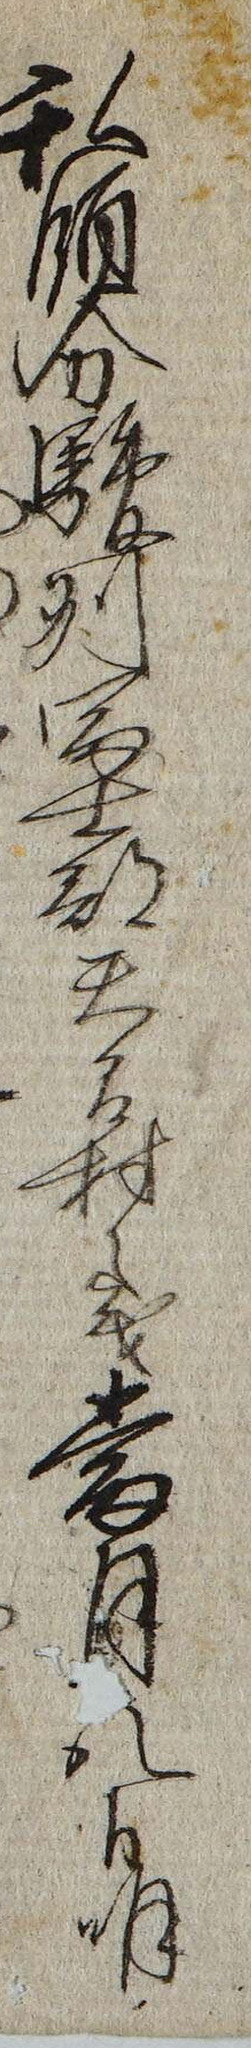私領分駿州富士郡天間村の義当月八日明
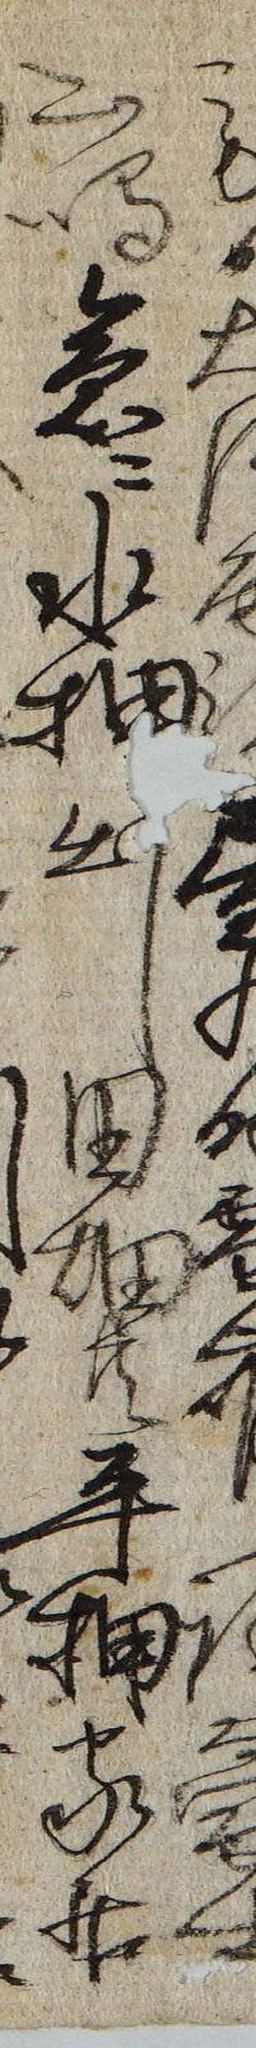山鳴急に水押出し田畑とも平押家居
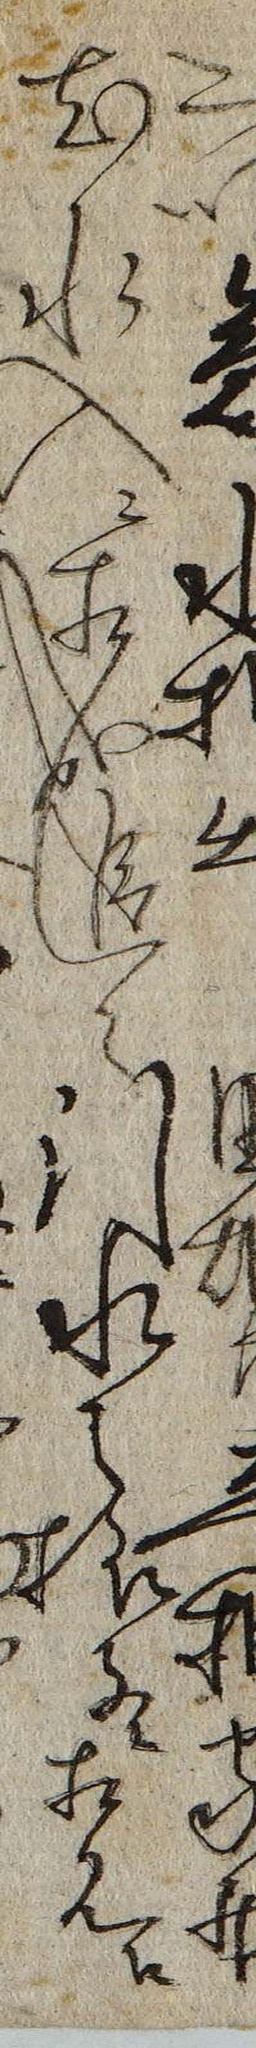尤水入に相成追々引水の様子に相見へ
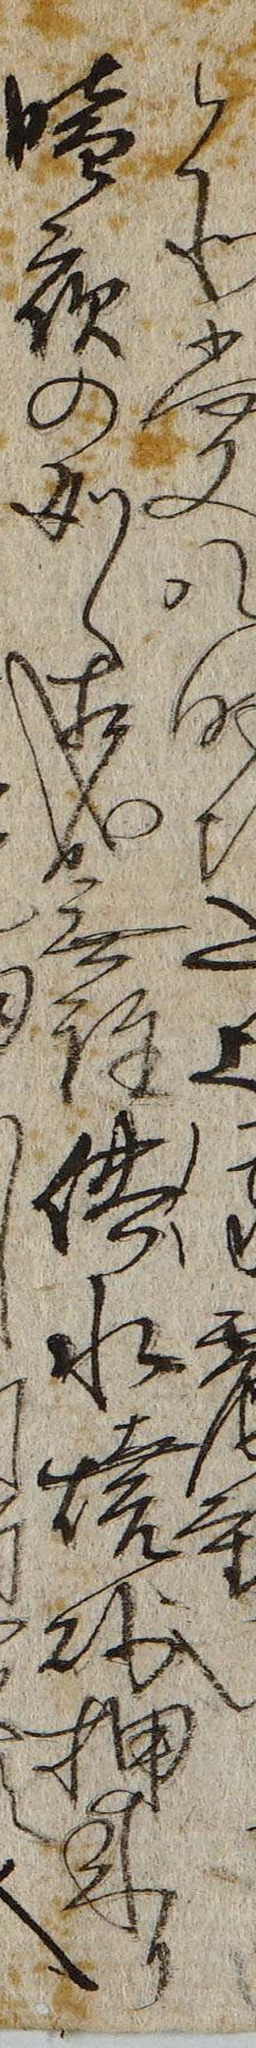暗夜の如く相成無程洪水焼砂押来り
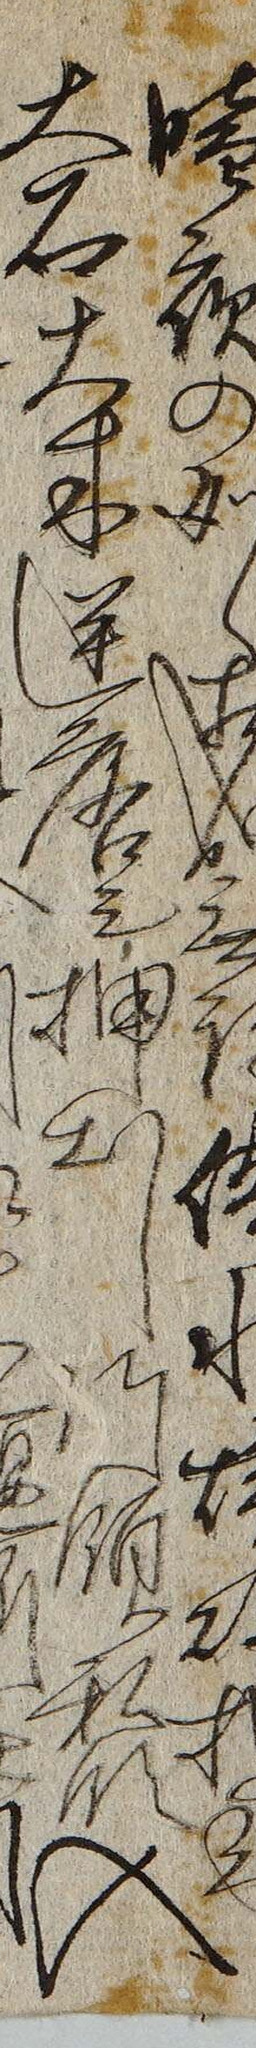大石大木逆落押出し御領私領入
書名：能登国清兵衛異国江漂流之始末
